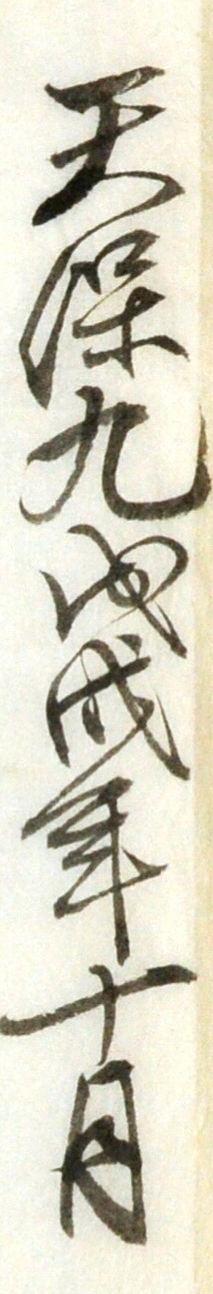天保九戊戌年十月
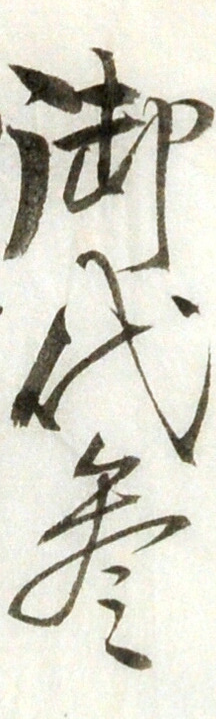御代参
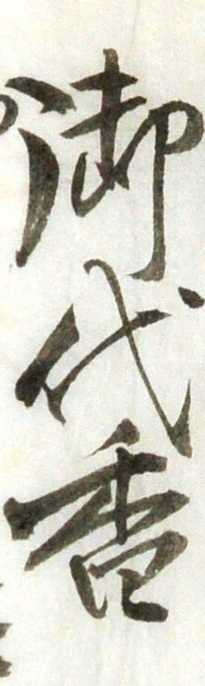御代参
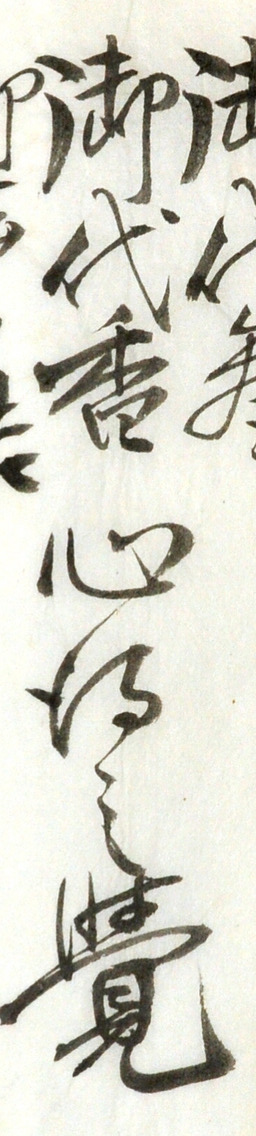御代番心得之覚
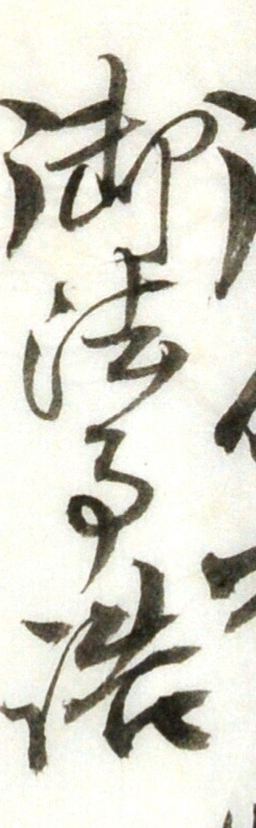御法事詰

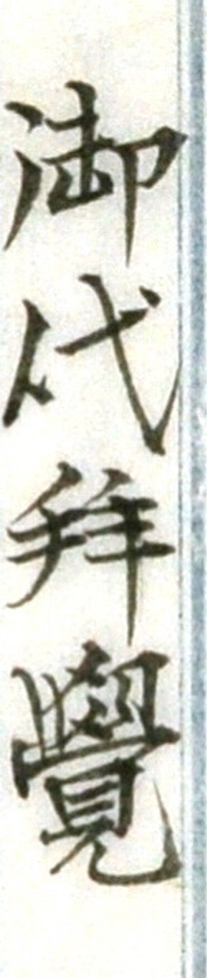御代拝覚
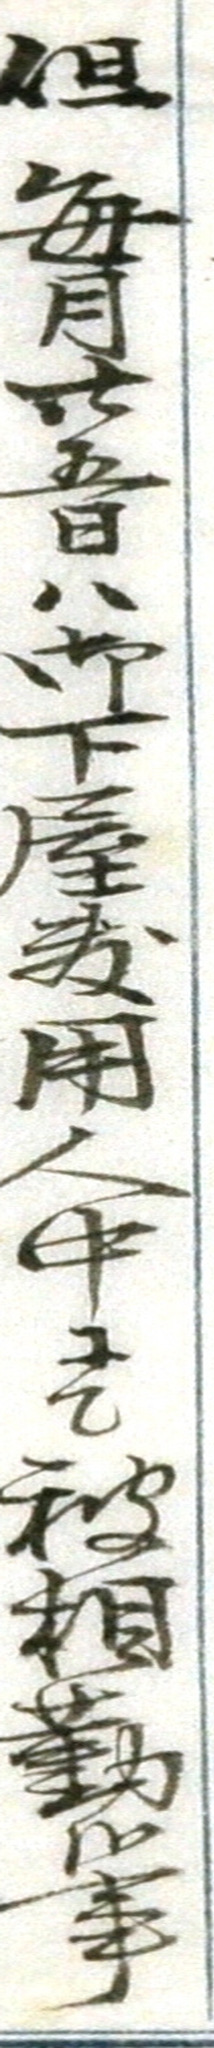但毎月廿五日ハ御下屋敷用人中にて被相勤候事
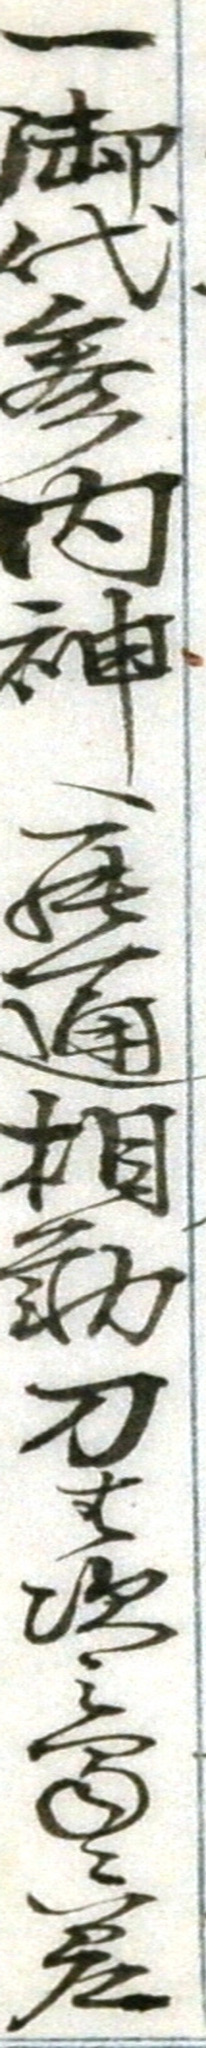一御代参内神へ罷通相勤刀者次之間ニ差
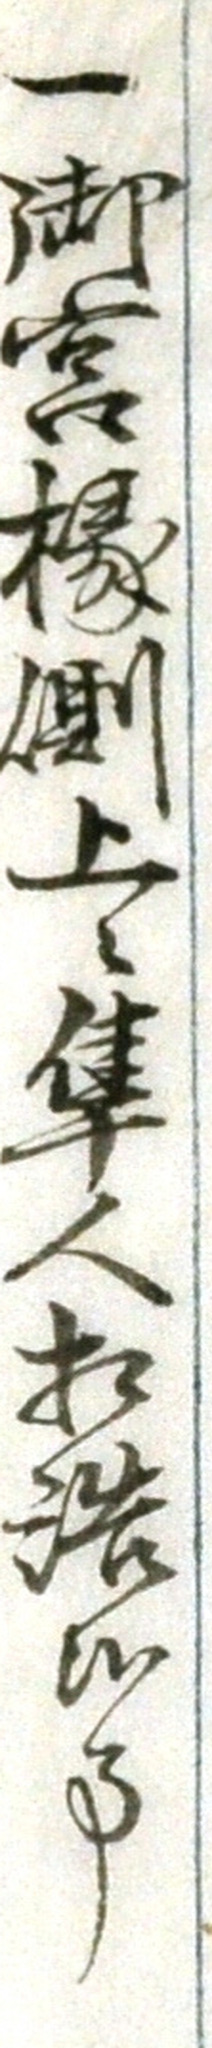一御宮縁側上ニ隼人相詰候事
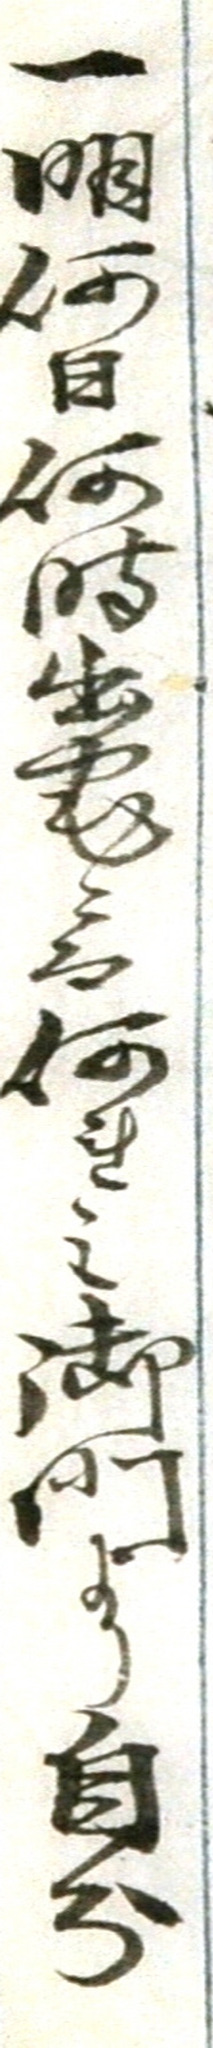一明何日何時出ニ而何れも御門より自分
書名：御代参・御代香・御法事詰心得之覚
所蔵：伊那市立高遠町図書館・合同会社AMANE
